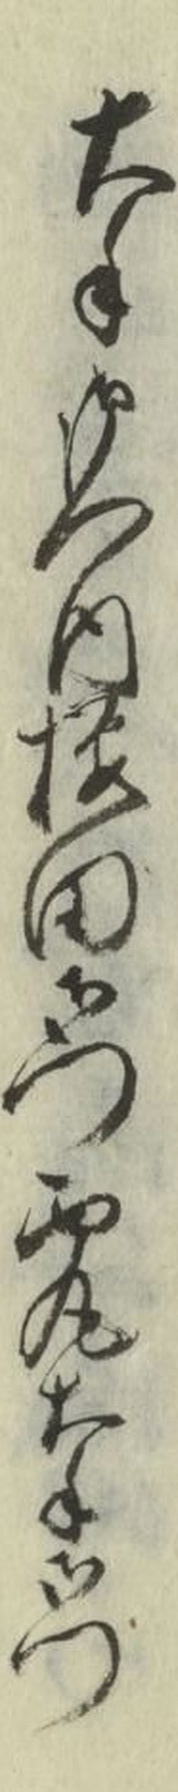大手御門内桜田御門西丸大手御門
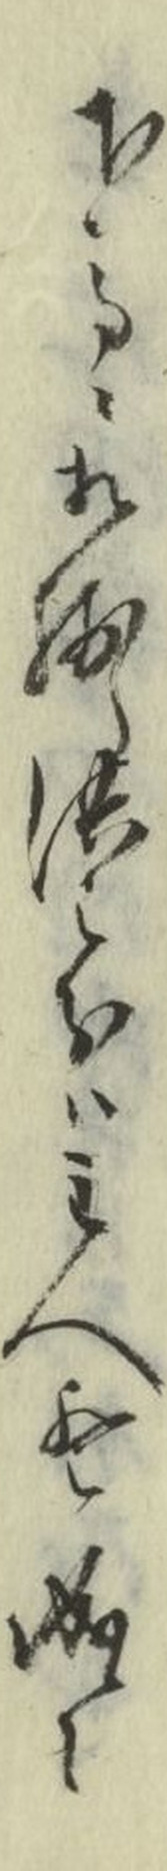下馬に相残候供之分は主人登城之

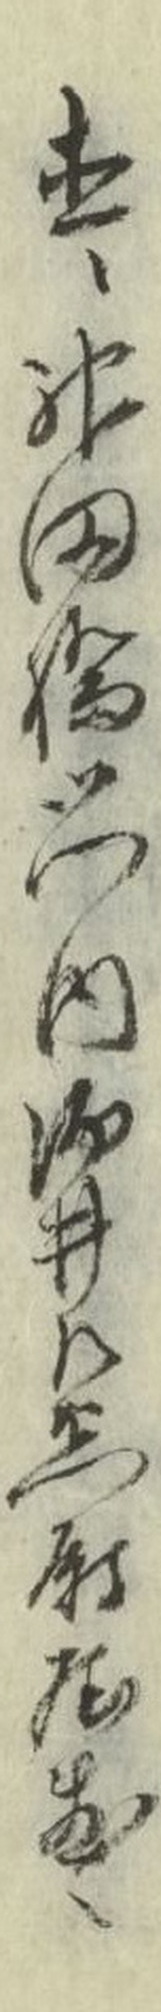直に神田橋御門内酒井左衛門尉屋敷之
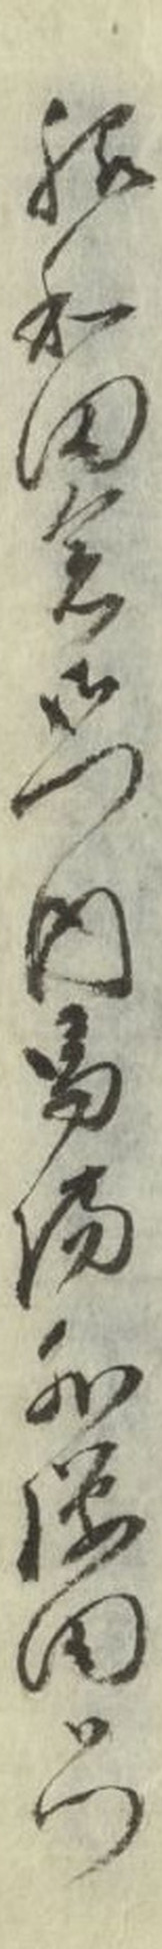脇和田倉御門内馬場外桜田御門
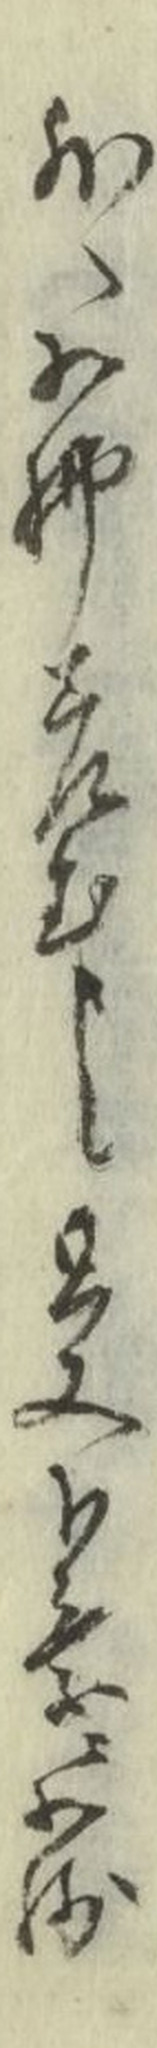外へ相払差置申候且又下乗に相残
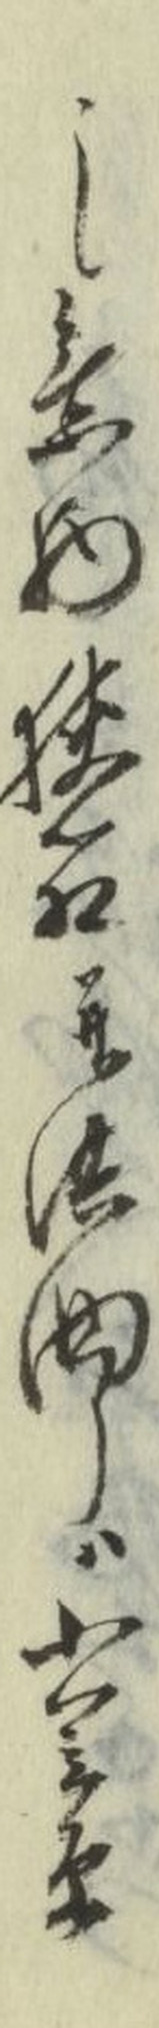之乗物挟箱幷供廻りは小笠原
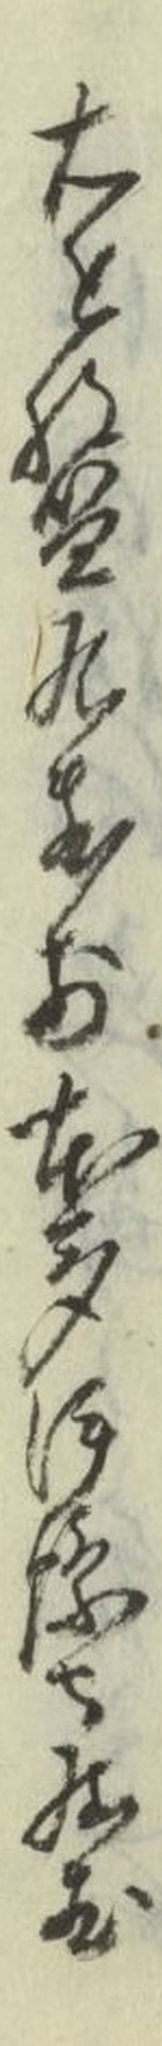右近将監屋敷前本多伊予守屋敷
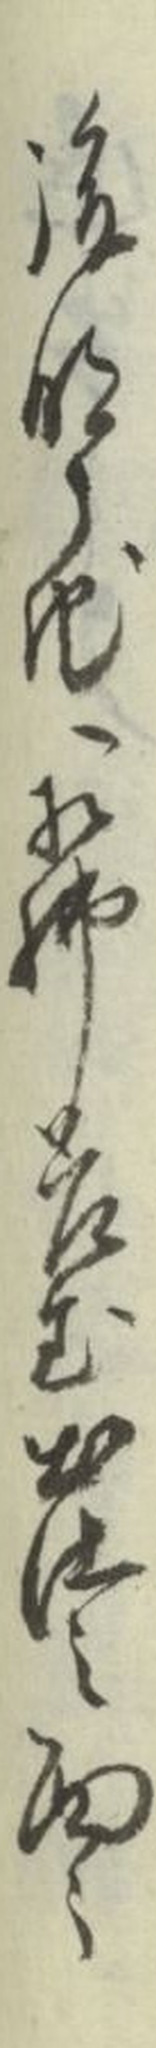後明候地へ相払差置出仕之面々
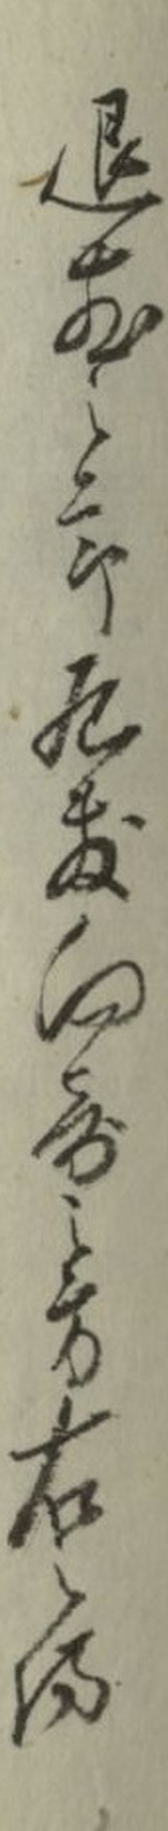退散之節屋敷向寄之方右之場
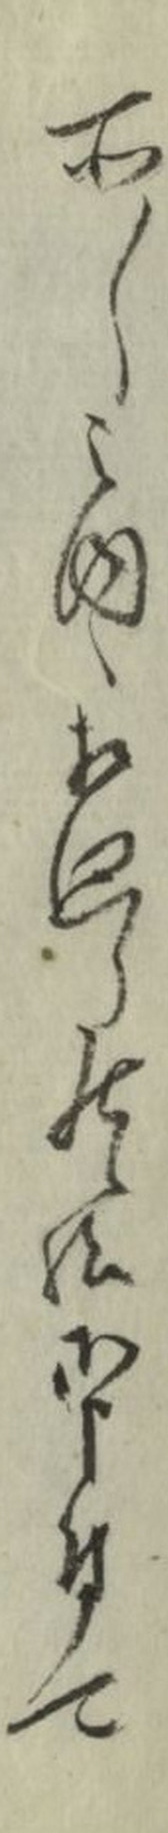所〳〵之内へ相廻り居候様御申付可
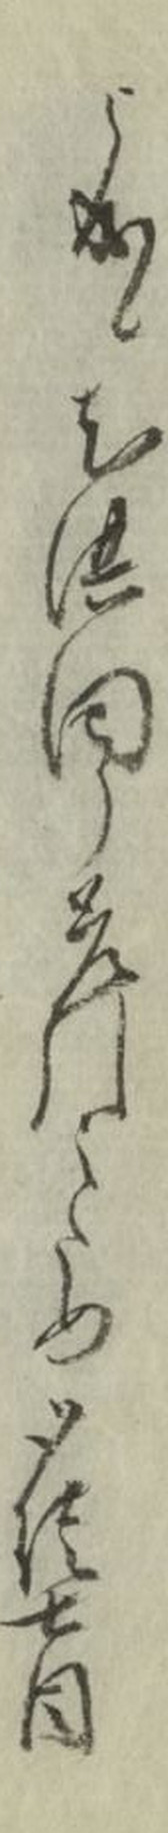被成候尤供回り差引之ため御徒士目
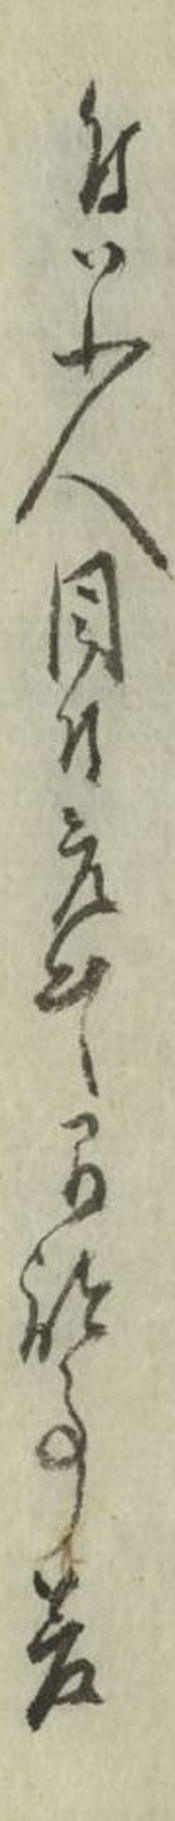付御小人目付差出候間諸事差
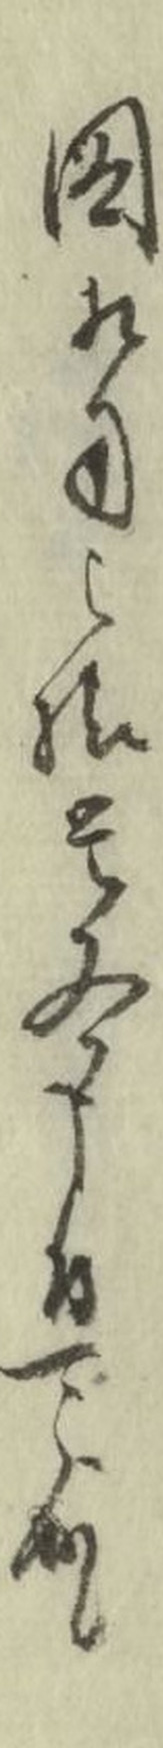図相用候様是又御申付可被成候

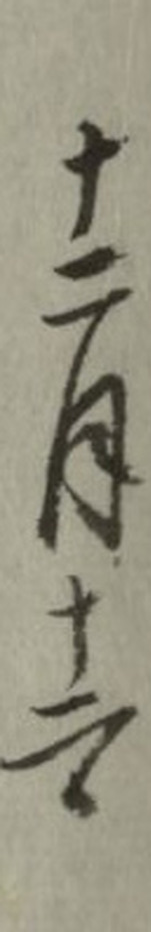十二月十二日
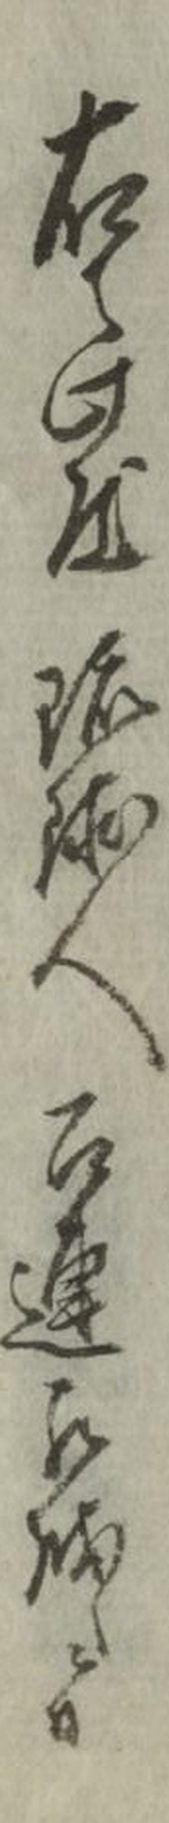右は此度琉球人召連被越候に付
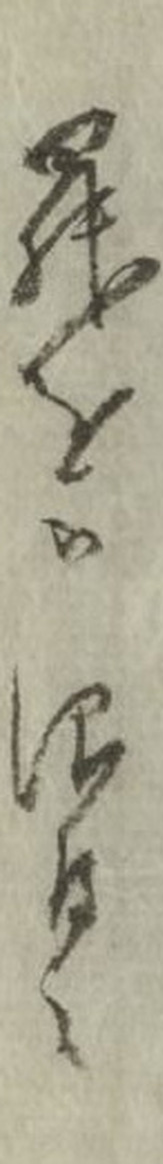昇進被仰付之
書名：琉球人来朝記 四之五
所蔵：University of the Ryukyus Library
